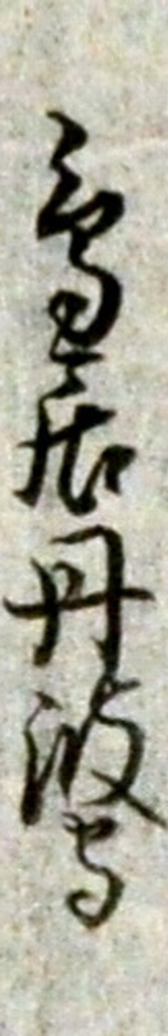鳥居丹波守
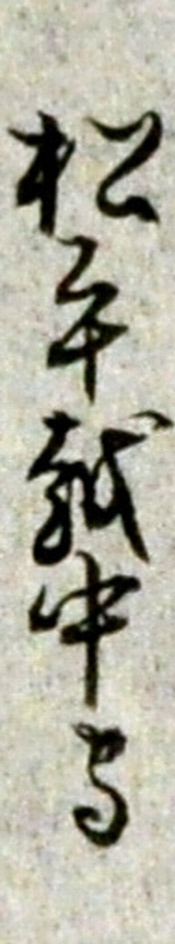松平越中守
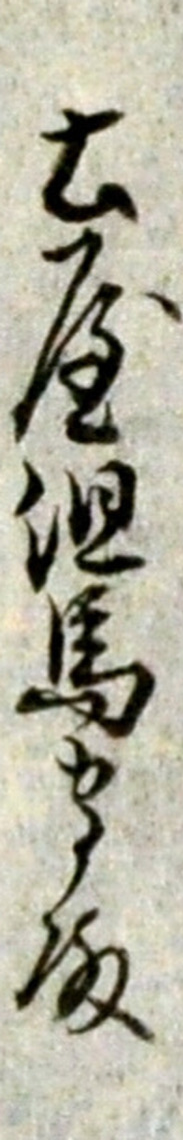土屋但馬守殿
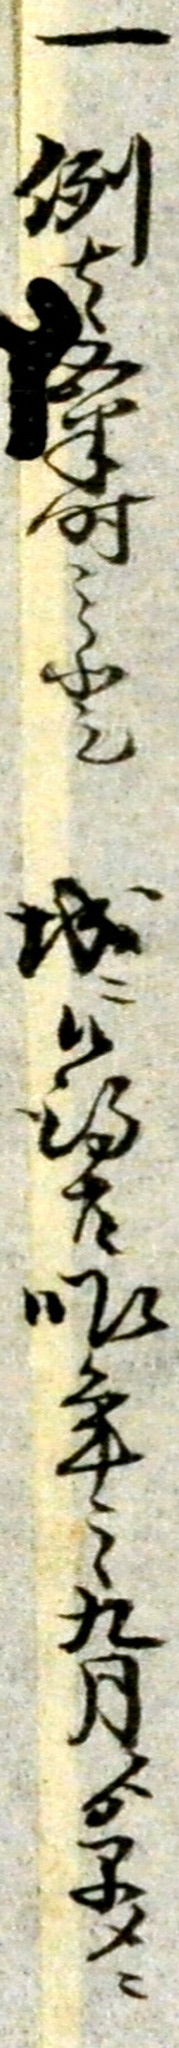一例者五半時之登城ニ候得共昨年之九月ゟ早メニ
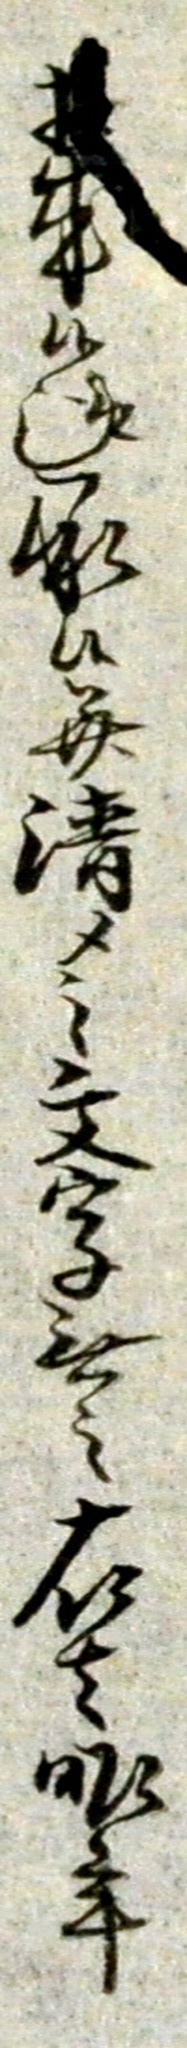相成候趣承候幷清メ之文字無之右者昨年
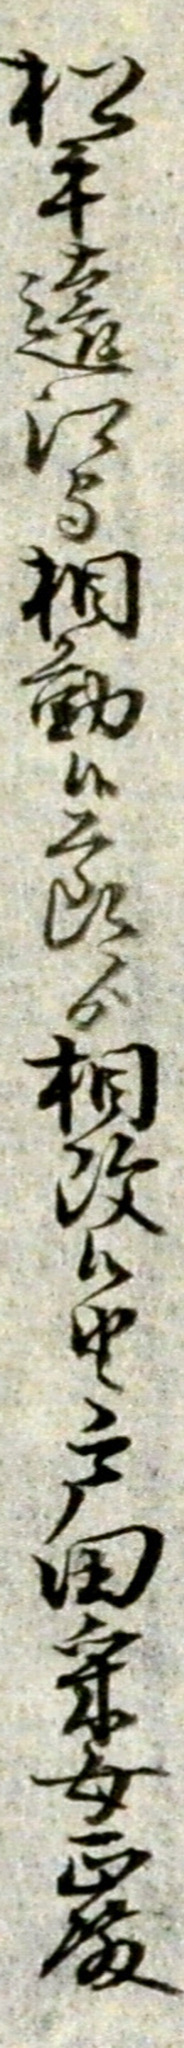松平遠江守相勤候節ゟ相改候由戸田采女正殿
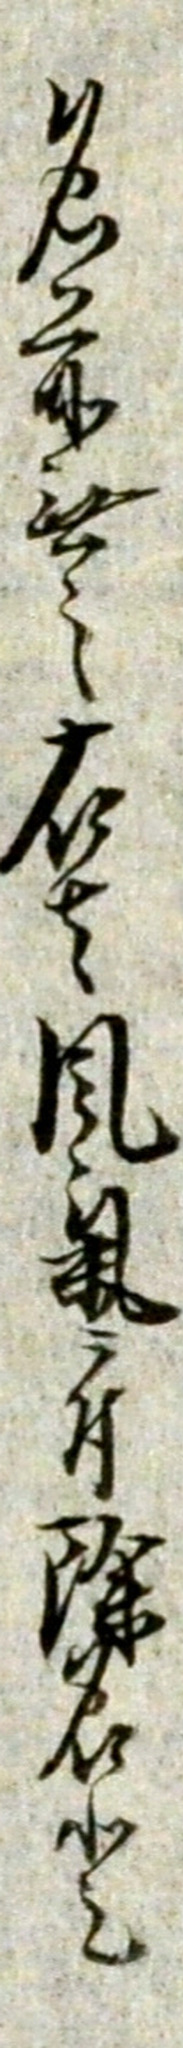名前無之右者風気ニ付除名登
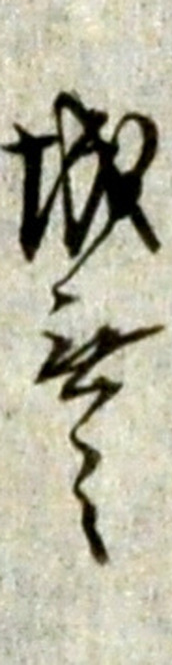城無之
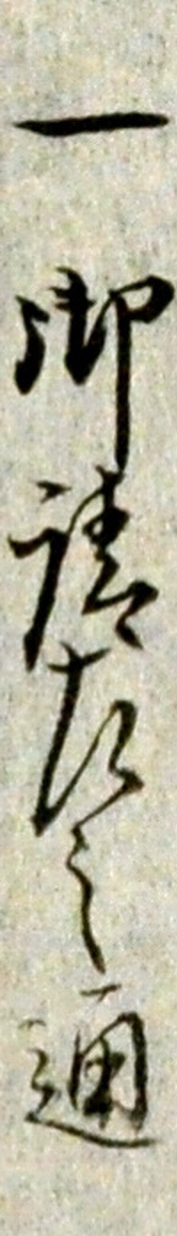一御請左之通
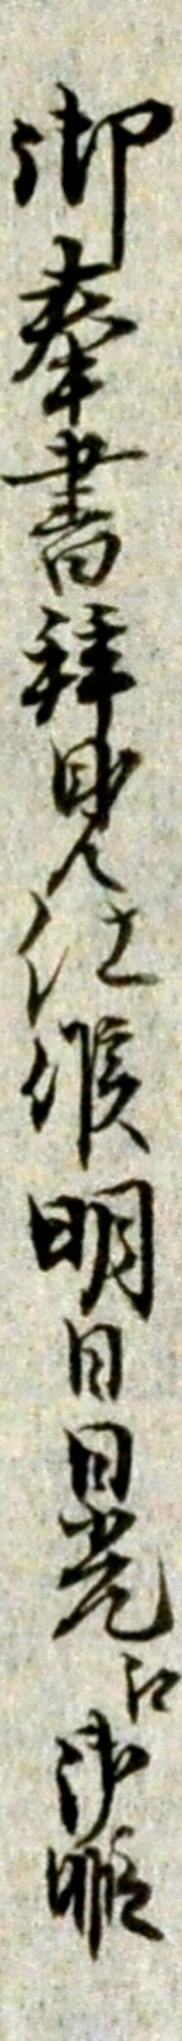御奉書拝見仕候明日日光江御暇
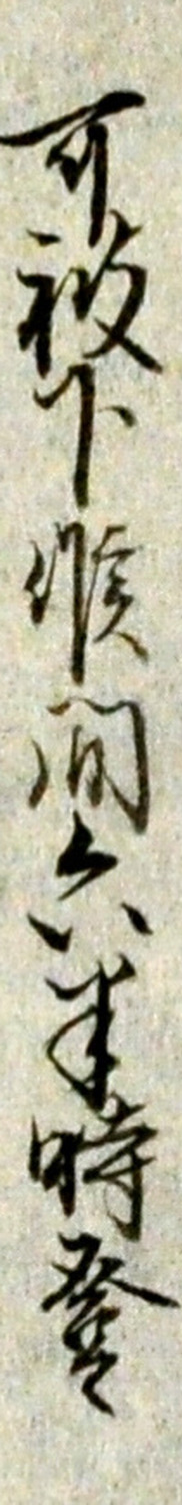可被下候間六半時登
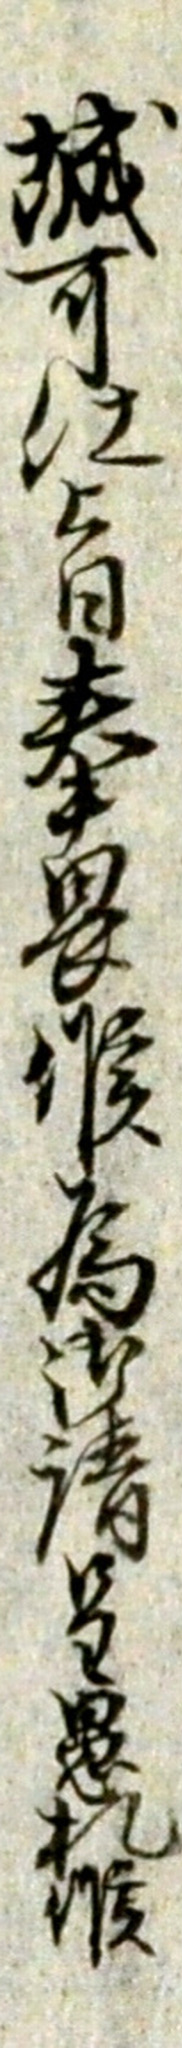城可仕旨奉畏候為御請呈愚札候
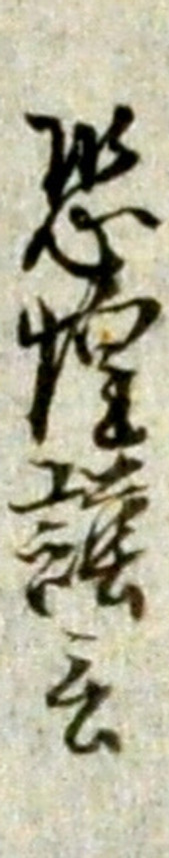恐惶謹言
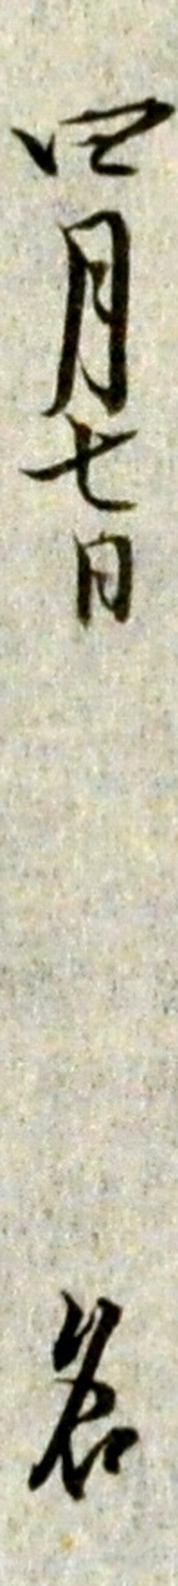四月七日名
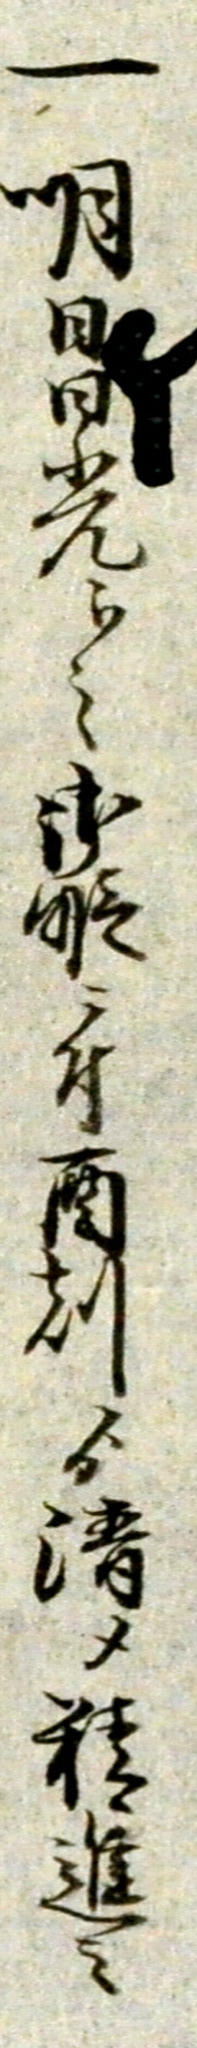一明日日光江之御暇ニ付酉刻ゟ清メ精進之
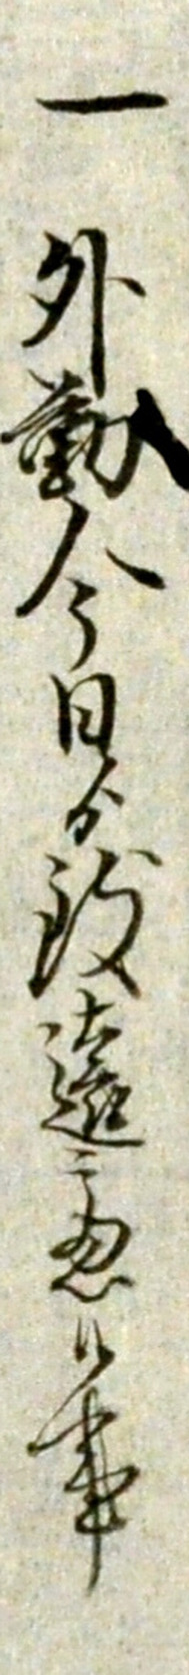一外勤今日ゟ致遠慮候事
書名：日光御名代相勤候節ノ留
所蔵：伊那市立高遠町図書館・合同会社AMANE
